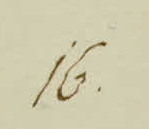16.
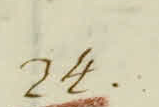24.
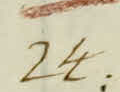24
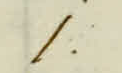1.
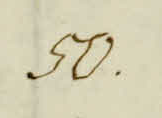50.
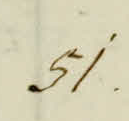51
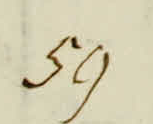59
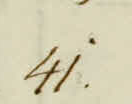41.
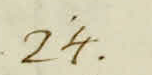24.
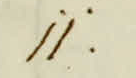11.
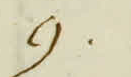9.
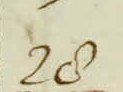28
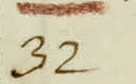32
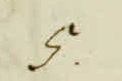5.
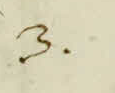3.
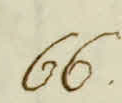66
